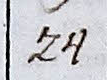24
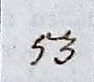53
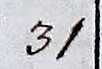31
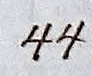44
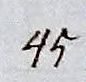45
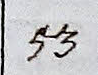53
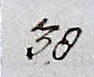38
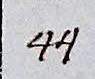44
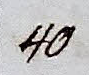40
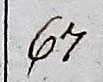67
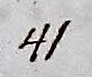41
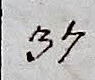37
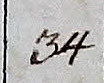34
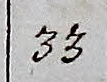33
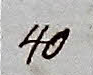40
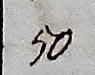50
